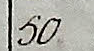50
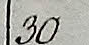30
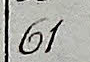61
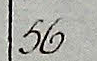56
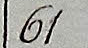61
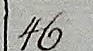46
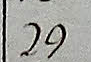29
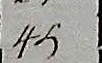45
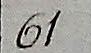61
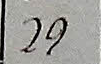29
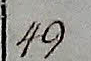49
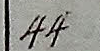44
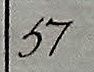57
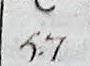57
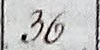36
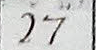27
